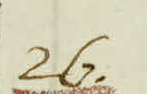26.
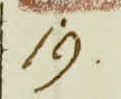19
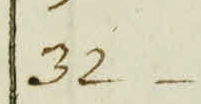32.
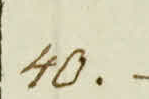40.
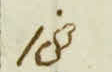18
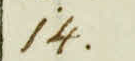14.
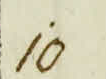10
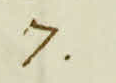7.
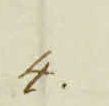4.
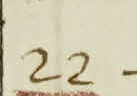22
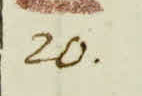20.
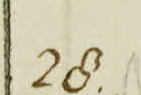28.
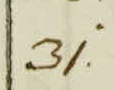31
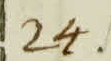24
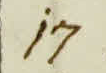17
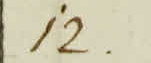12.
